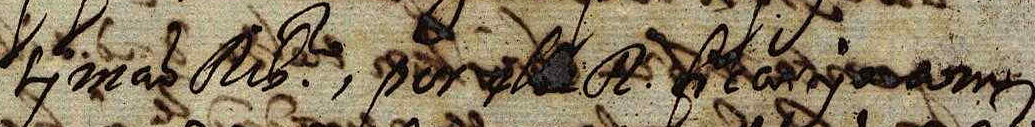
symaõ Rib.ro, por ele R. ficar ya com
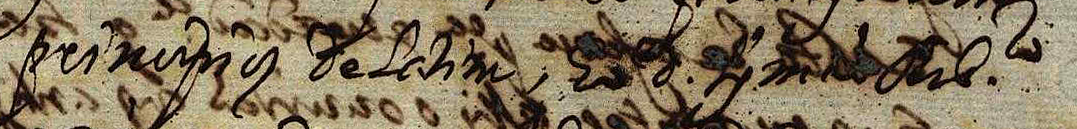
principios de Latim, E o d. symaõ Rib.ro
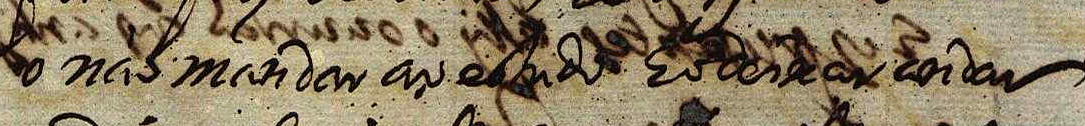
o naõ mandar ao estudo E o deixar andar
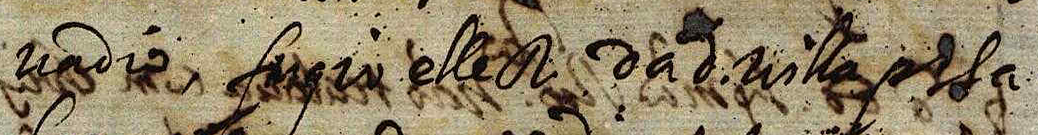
uadio, fugio elle R da d. uilla pa Sa
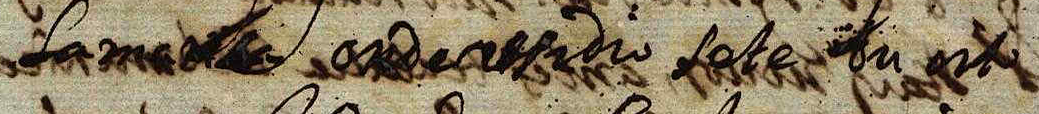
lamanca onde residio sete ou oito
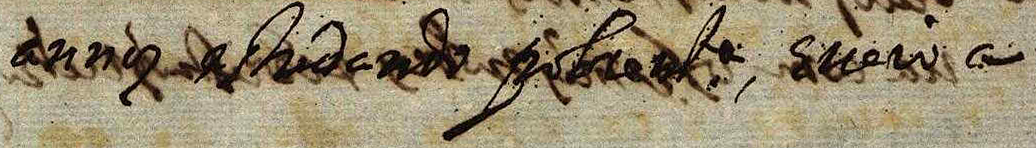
annos estudando pobremt.e, E ueio a
